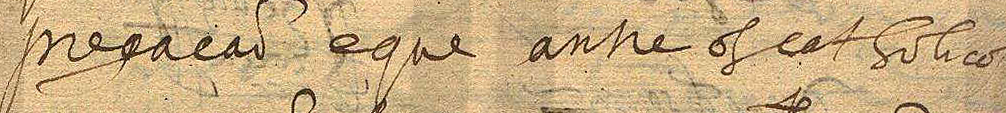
pregação e que antre os catholicos
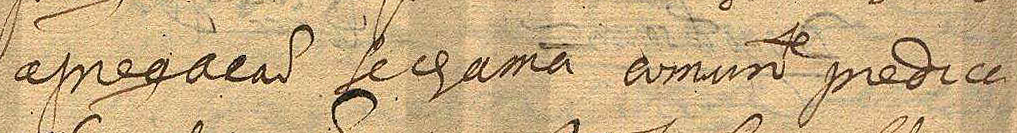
a pregaçaõ se chama comumte predica
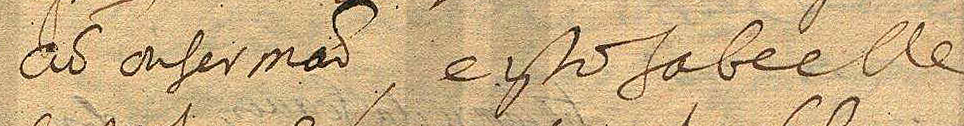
ção ou sermão, e isto sabe elle
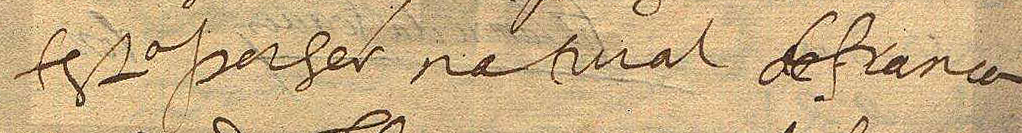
testa por ser natural de frança
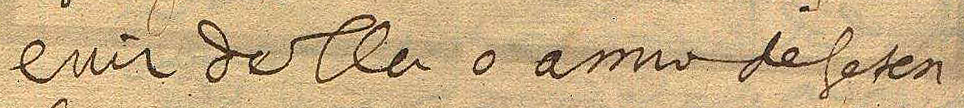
e uir della o anno de seten
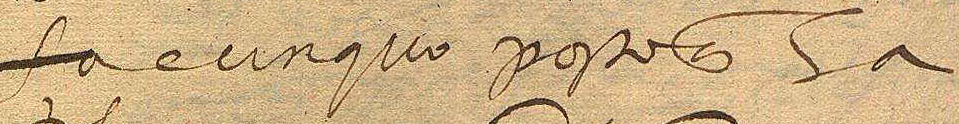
ta e cinquo posto q̄ ha
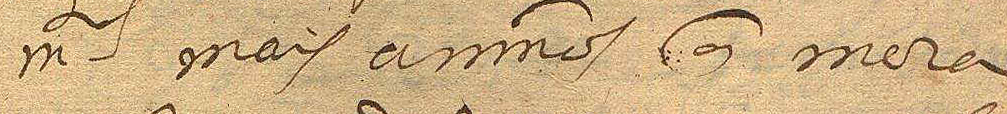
mtos mais annos q̄ mora
